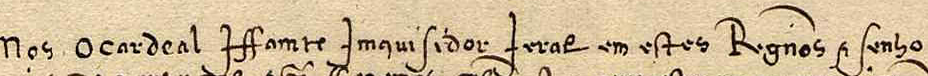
Nos O cardeal Jffamte Jmquisidor Jeral em estes Regnos e senho
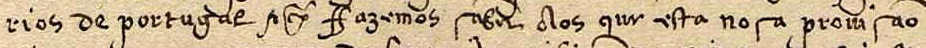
rios de portugal e c̄ꝭ ffazemos saber Aos que esta nosa prouisaõ
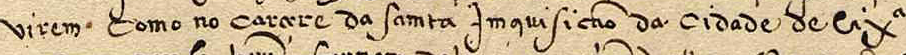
virem como no carçere da samta Jmquisição da cidade de lixa
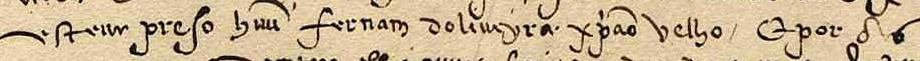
esteue preso hūu fernam doliueyra xpão velho / E por As
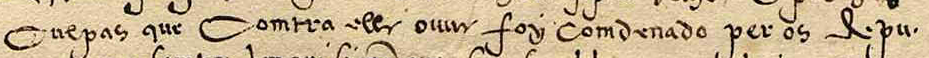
Culpas que Comtra elle ouue foy comdenado per os depu
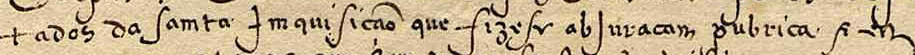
tados da samta Jmquisição que fizese abJuraçam pubrica. e em
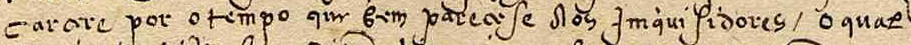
carçere por o tempo que bem pareçese Aos Jmquisidores / o qual
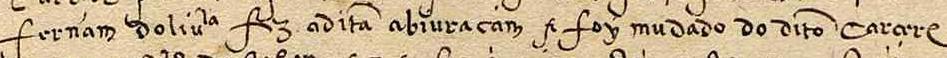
fernam doliura fez a dita abiuraçam e foy mudado do dito carçere
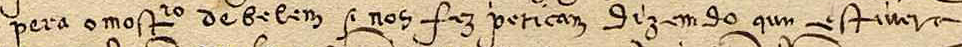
pera o mostro de belem e nos fez peticam dizemdo que estiuera
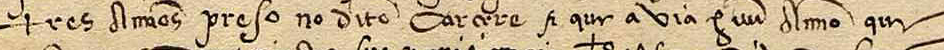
tres Annos preso no dito Carçere e que avia huū Anno que
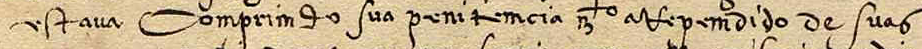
estaua Comprimdo sua penitemcia mto aRepemdido de suas
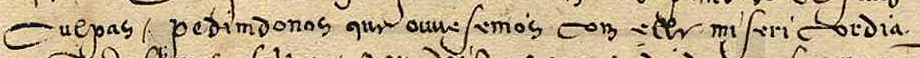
Culpas / pedimdonos que ouuesemos com elle misericordia
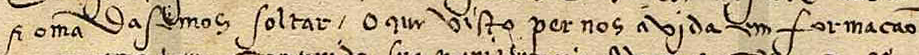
e o mādasemos soltar / O que visto per nos avjda emformação
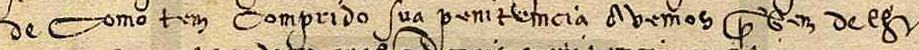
de Como tem Comprido sua penitemcia Avemos p̄o bem de lhe
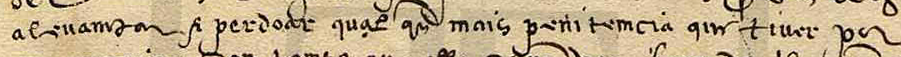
aleuamtar e perdoar qualq̄r mais penitemçia que tiuer por
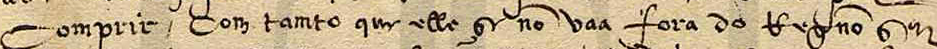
Comprir / comtamto que elle se n̄o vaa fora do Regno sem
